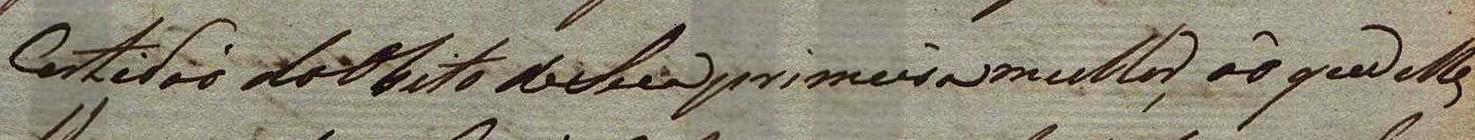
Certidaõ do Obito de Sua primeira mulher, aõ que elle
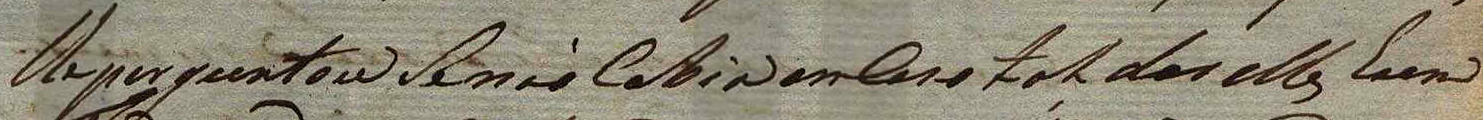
lhe perguntou Se naõ Cabia em Caso taL dar elle hum
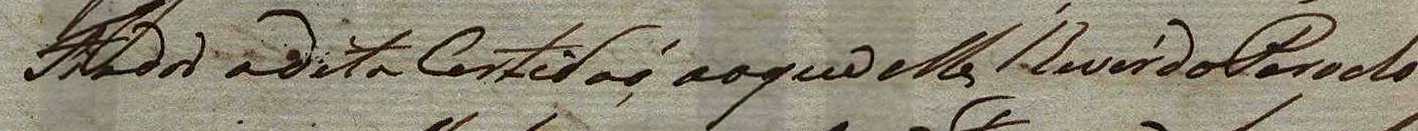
Fiador a dita Certidaõ, ao que elle Rever̄do Parocho
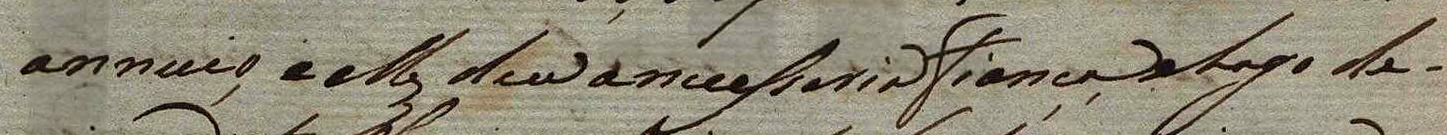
annuio, e elle deu a necessaria fiança, e Logo de
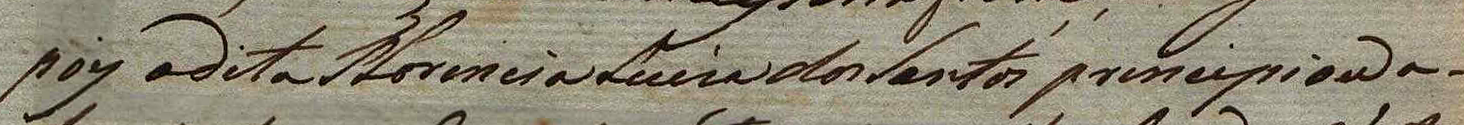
pois a dita Florencia Luiza dos Santos principiou a
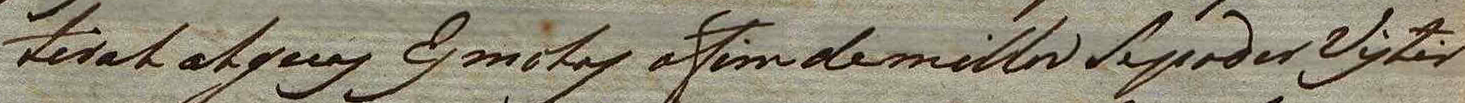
tiral alguas Esmolas a fim de milhor Se poder Vistir
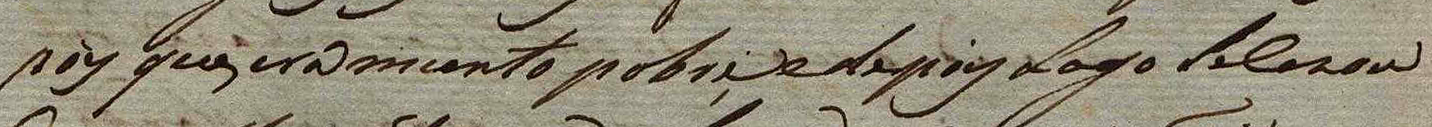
pois que era munto pobre, e depois Logo se Cazou
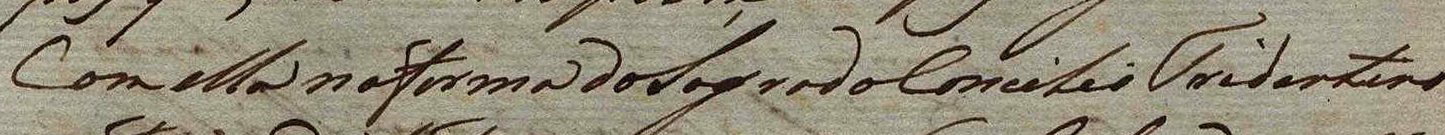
Com ella na forma do Sagrado Concilio Tridentino
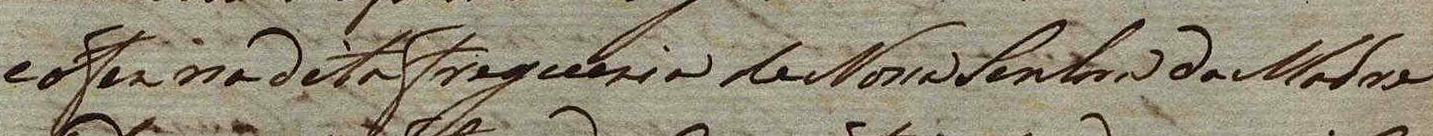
e o fez na dita freguezia de Nossa Senhora da Madre
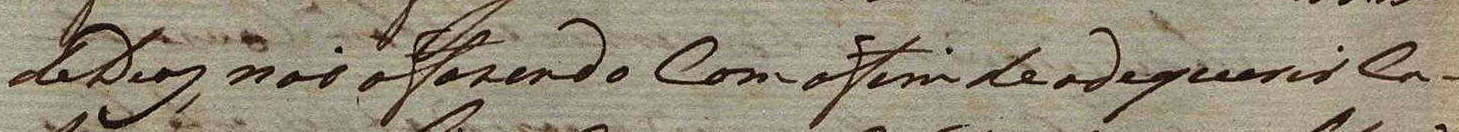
de Deos, naõ o fazendo Com o fim de adequerir Ca
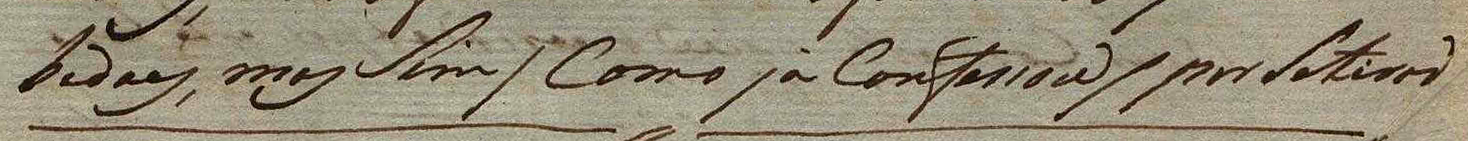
bedaes, mas Sim / Como ja Confessou / por Se tirar
